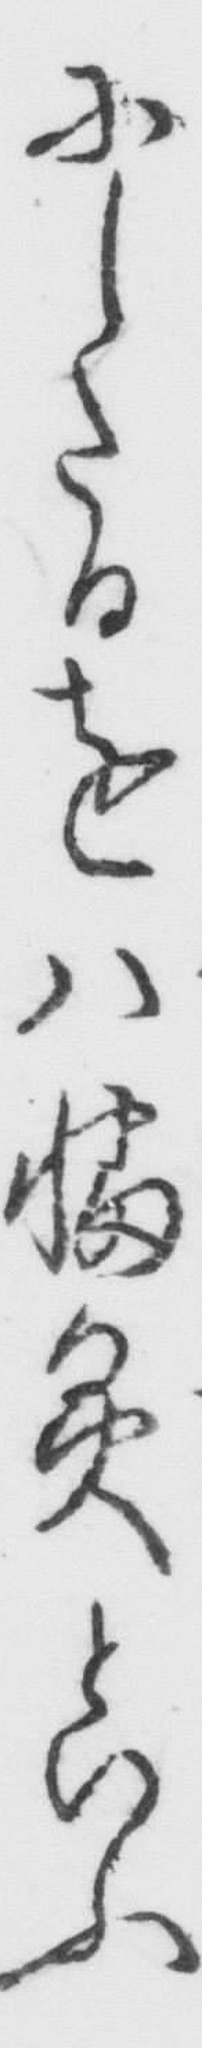にしたるを八幡炙といふ

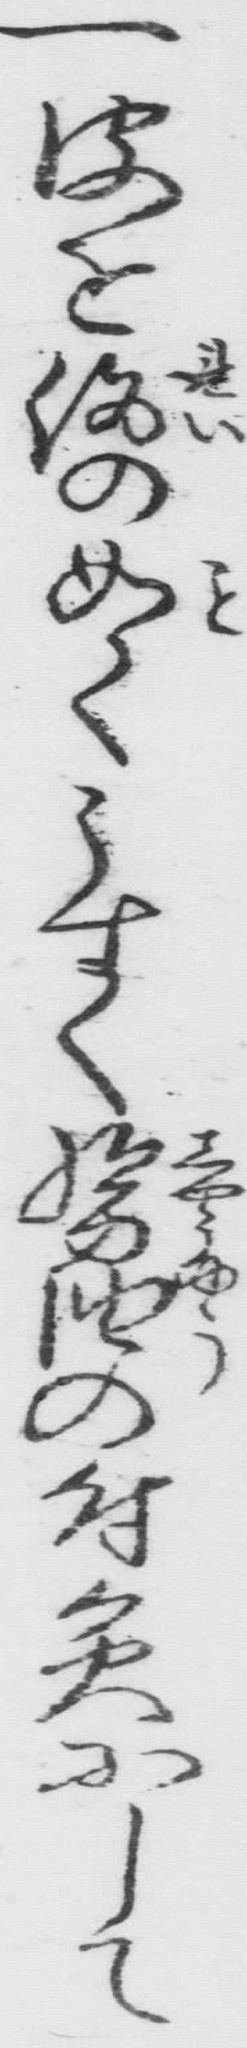一皮を例の如くうすく醤油の付炙にして
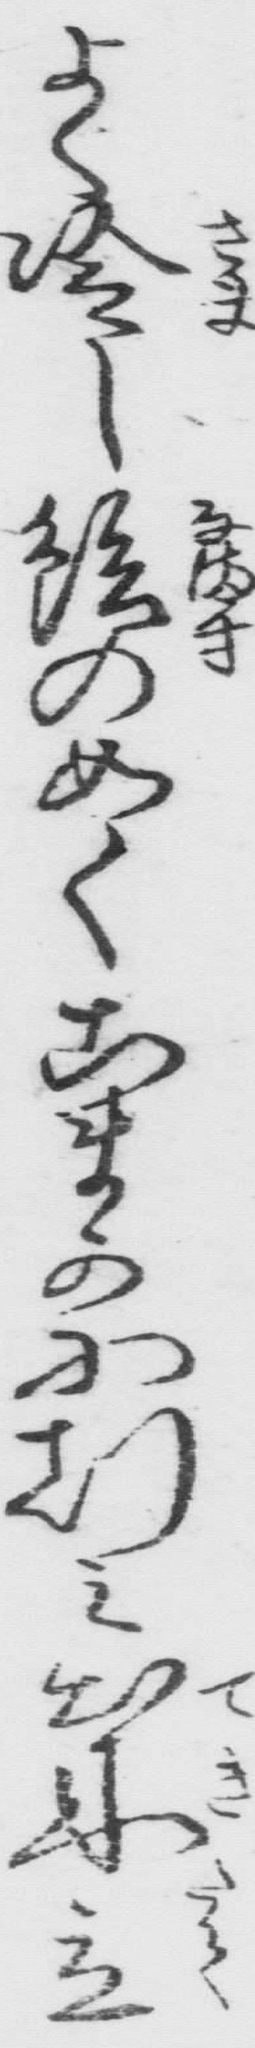よく冷し鱠の如くこまかに刻み出来立
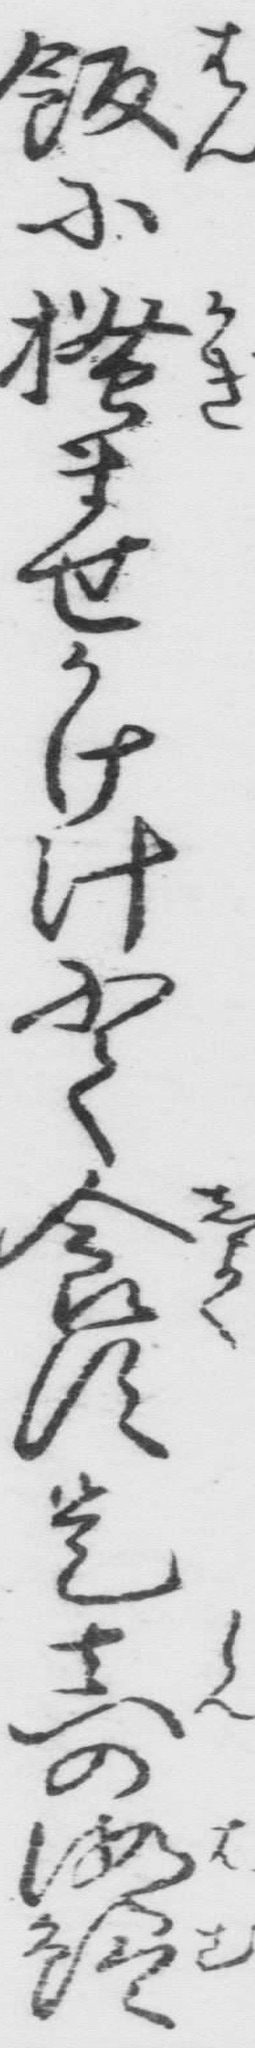飯に掻ませかけ汁にて食す是真の海鱧
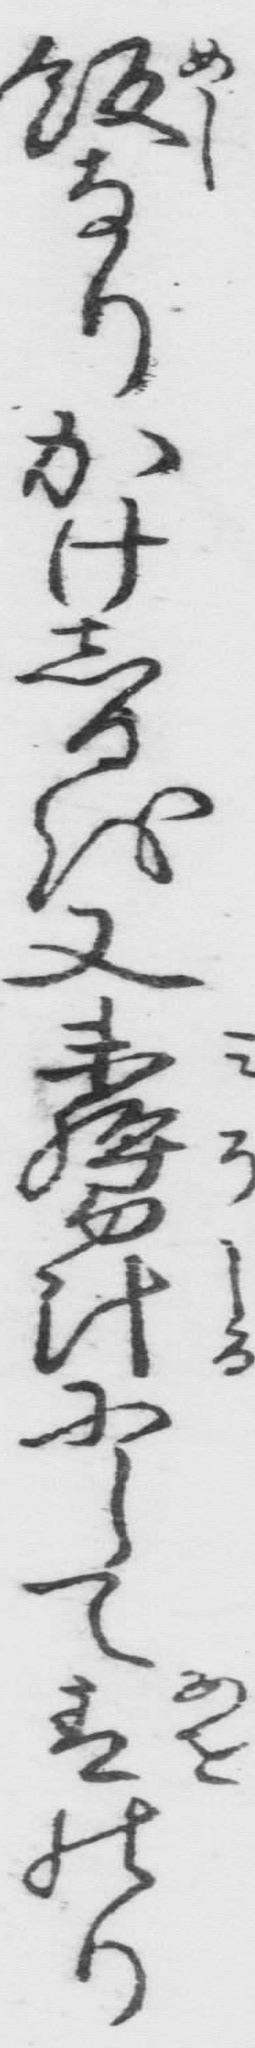飯なりかけしるを又未醤汁にして青のり
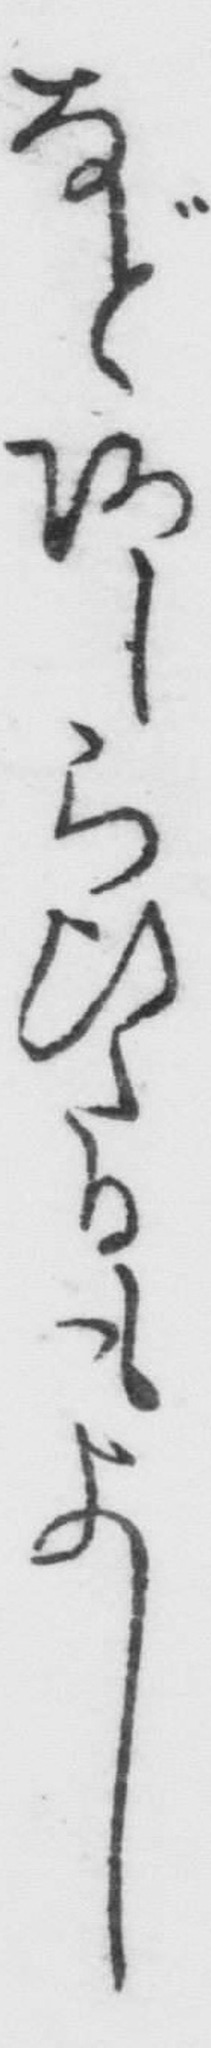などあしらひたるもよし
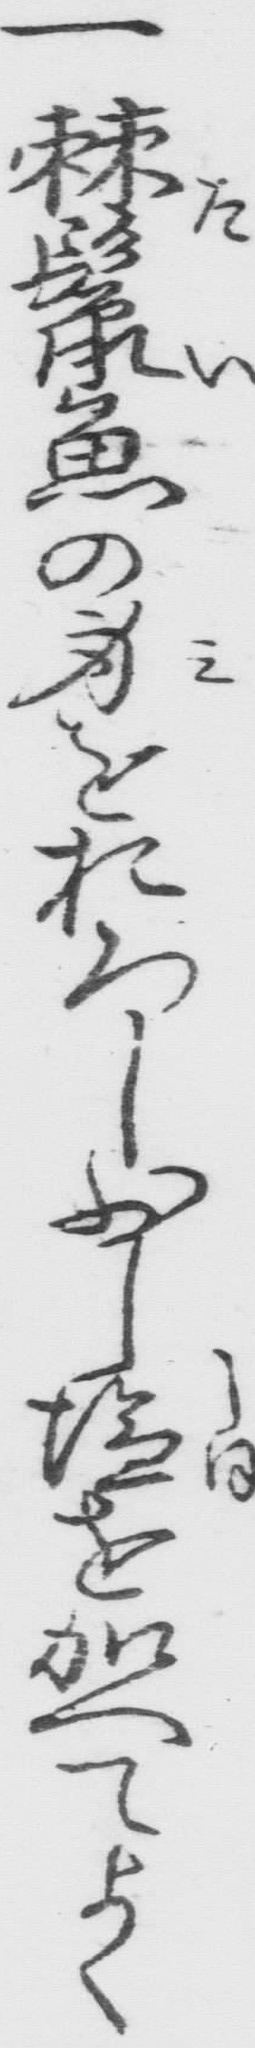一棘鬣魚の身をおろし少し塩を加へてよく
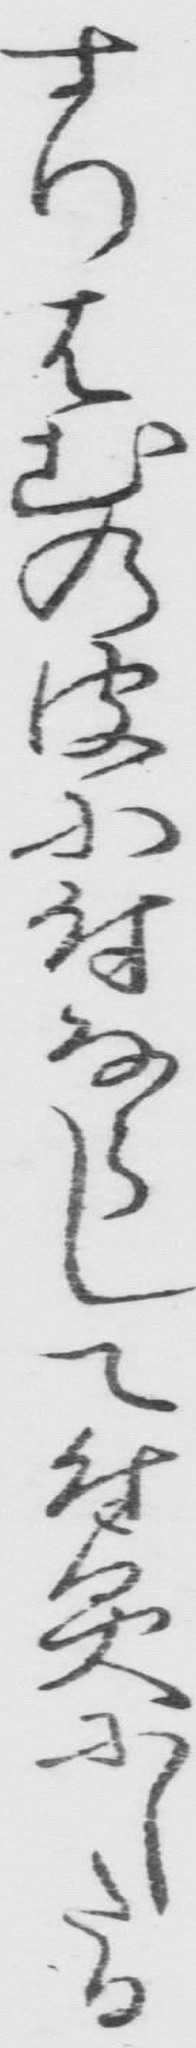すりはむの皮に付ならして付炙にしたる
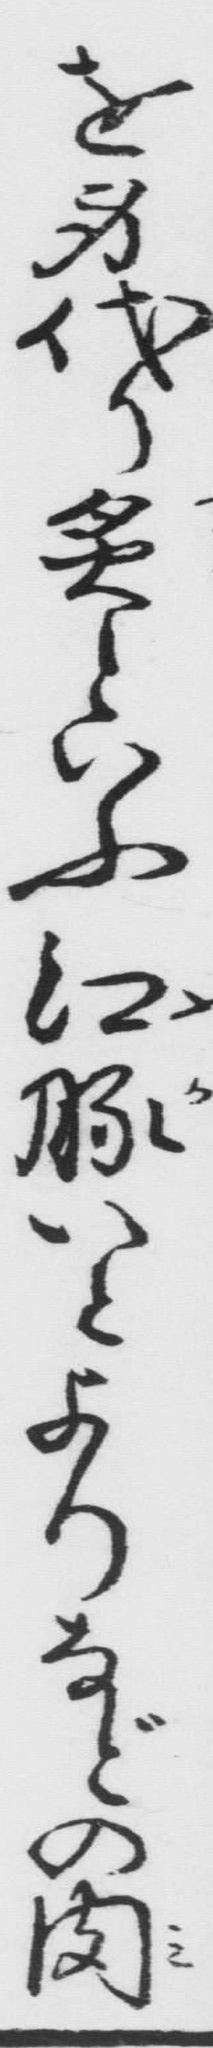を身代り炙といふ河豚いとよりなどの肉
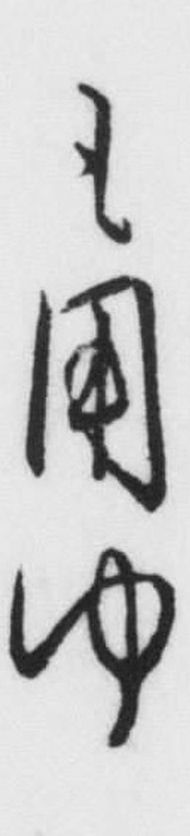を用ゆ
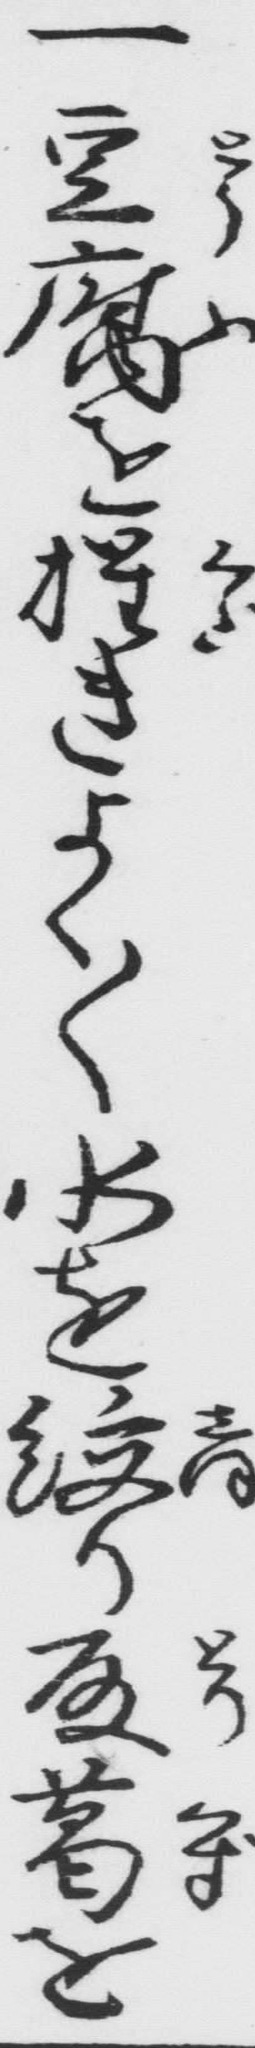一豆腐を摧きよく〳〵水を絞り取葛を
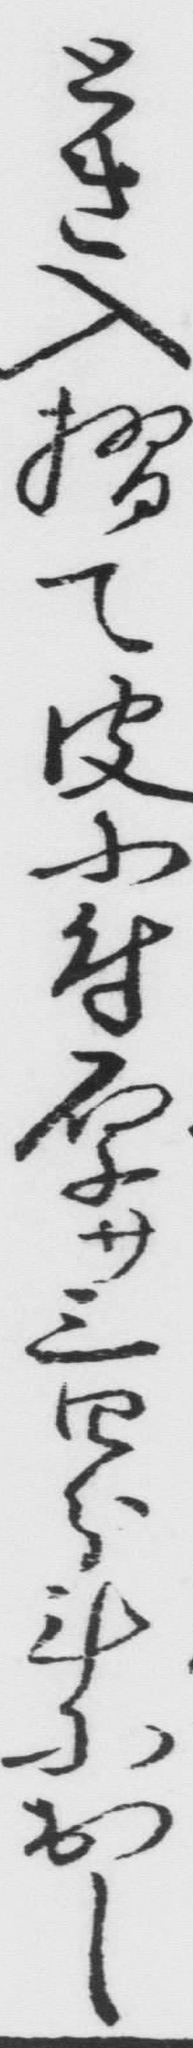とき入摺て皮に付厚さ三四分斗におし
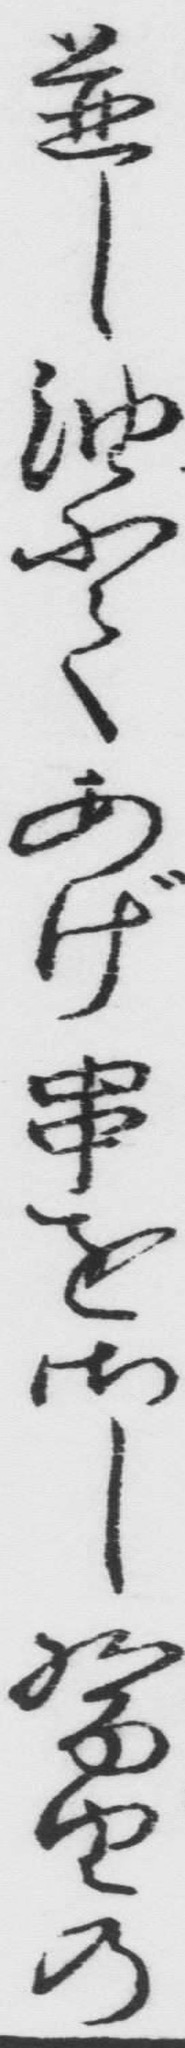並し油にてあげ串をさし醤油の
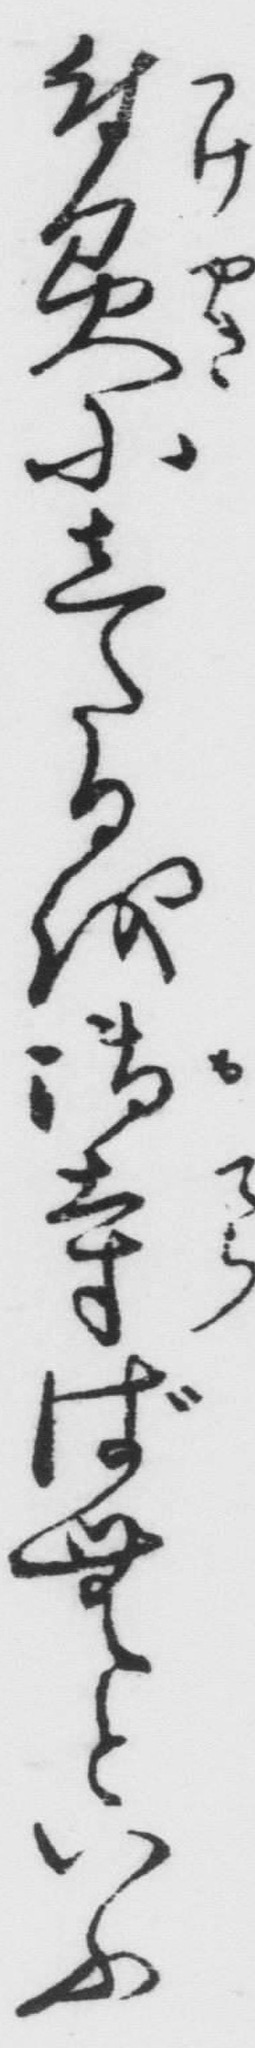付炙にしたるを御寺ばむといふ
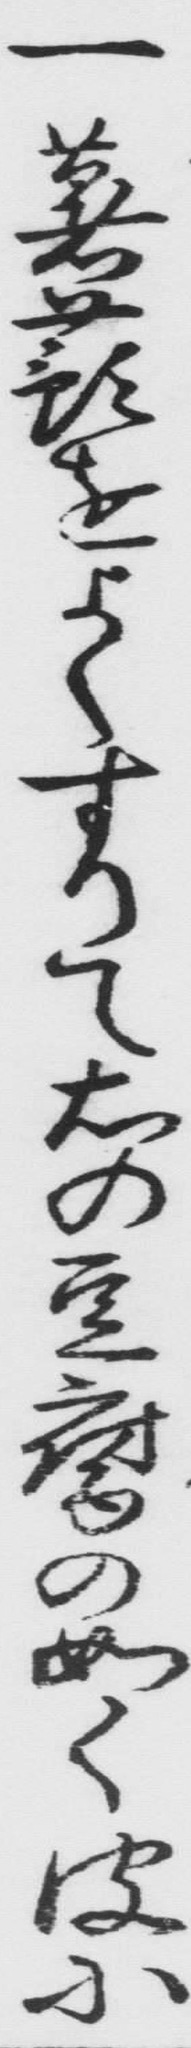一薯蕷をよくすりて右の豆腐の如く皮に

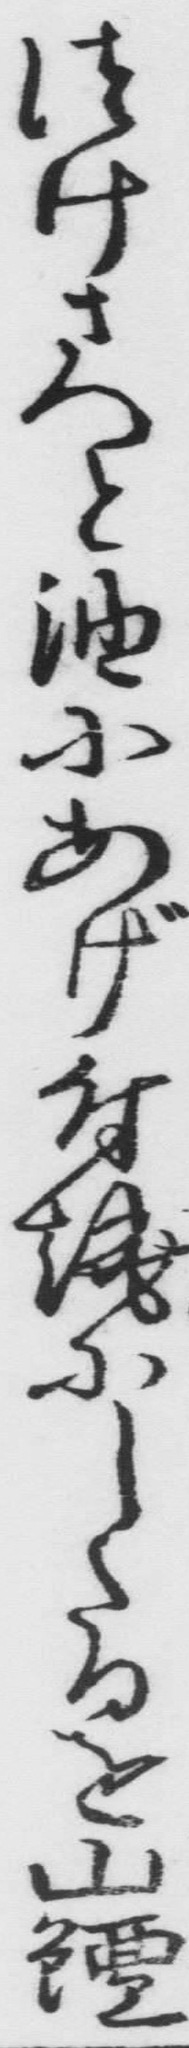つけさつと油にあげ付燒にしたるを山鱣
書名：海鰻百珍
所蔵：大阪府立大学学術情報センター 国文学研究資料館
